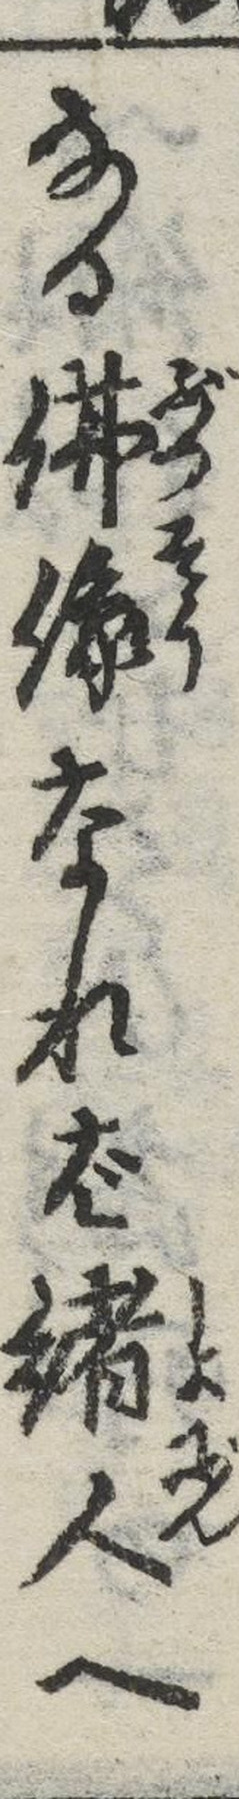なる仏像なれば諸人へ
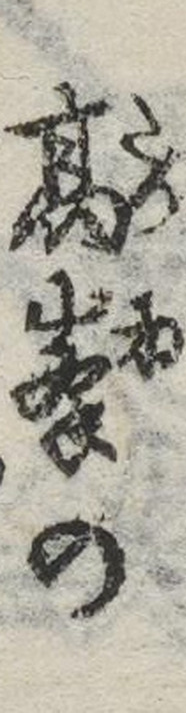高嶺の
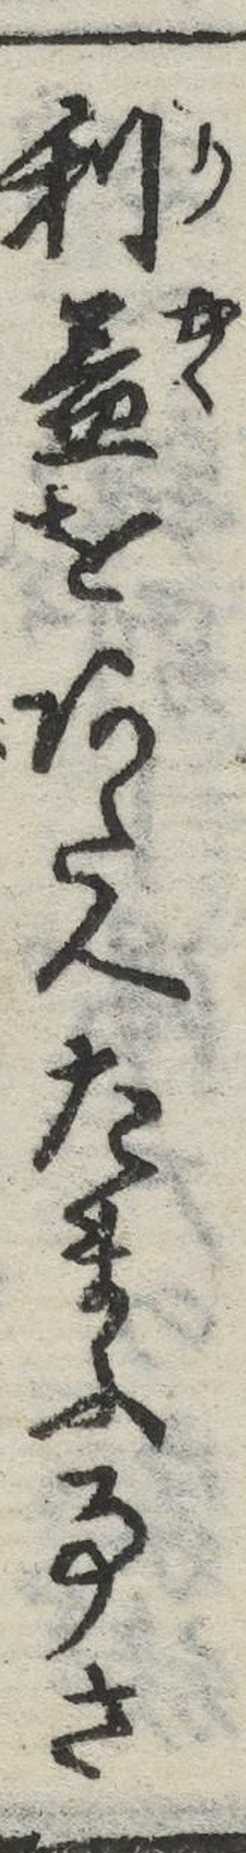利益をあたへたまふ事さ
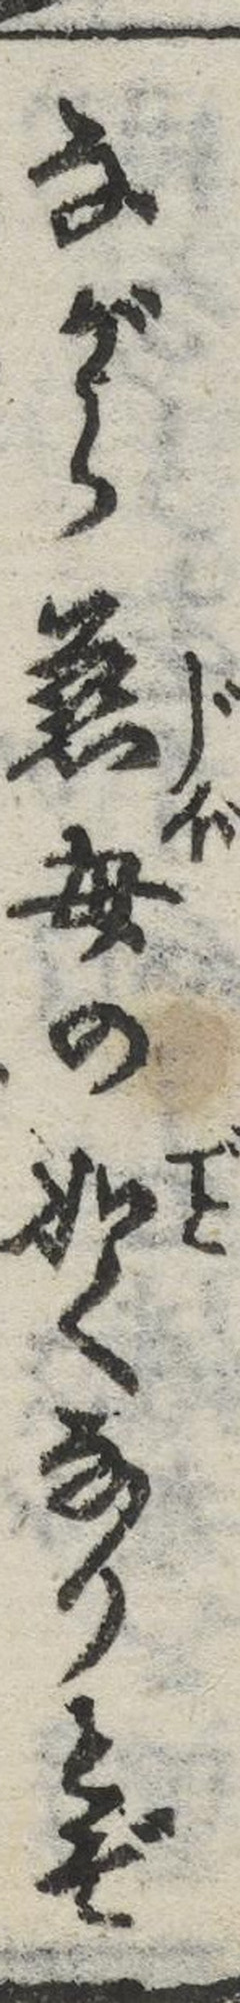ながら慈母の如くなりとぞ
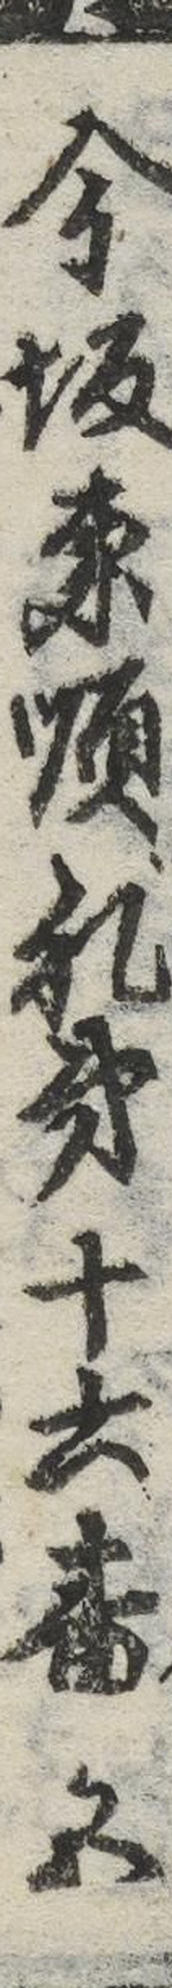今坂東順礼第十六番五
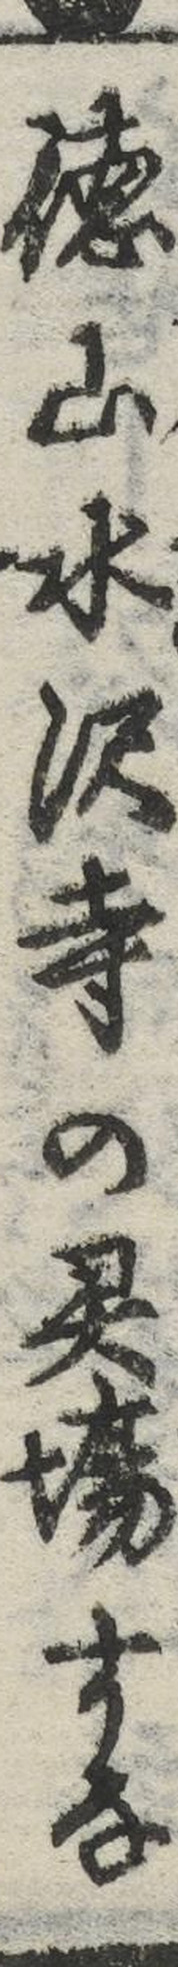徳山水沢寺の霊場すな
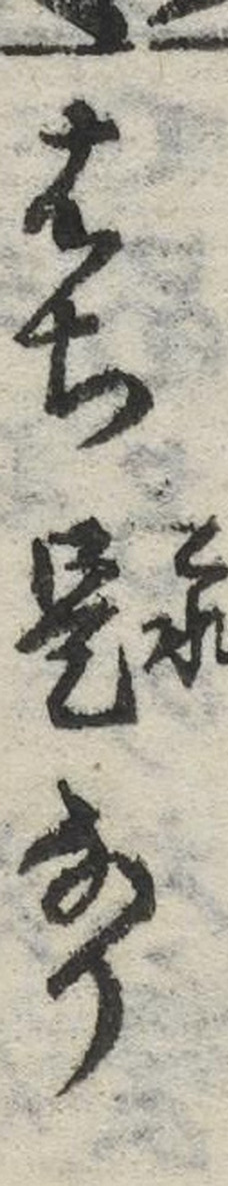はち是なり
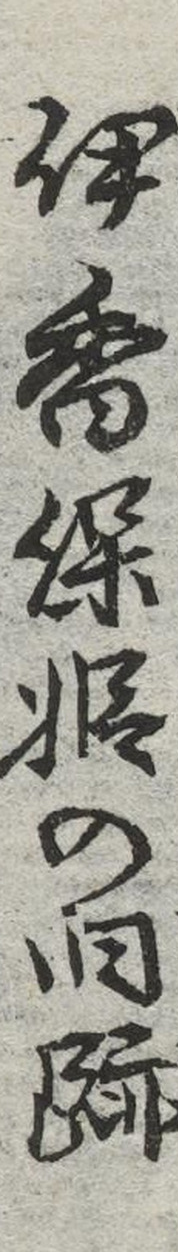伊香保姫の旧跡
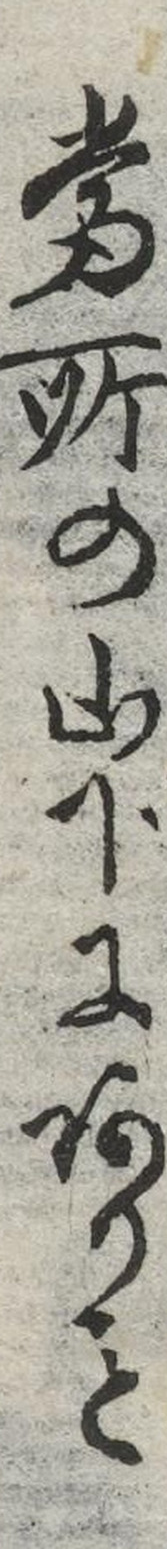当所の山下にありと
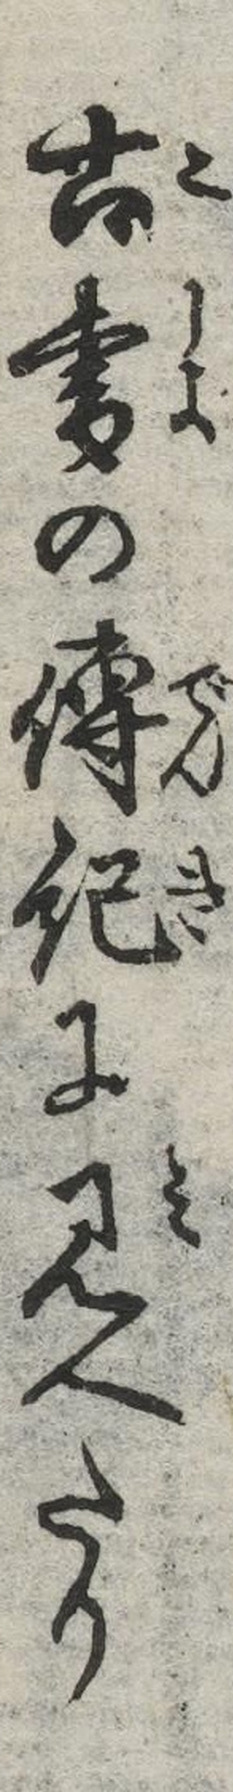古書の伝記に見へたり

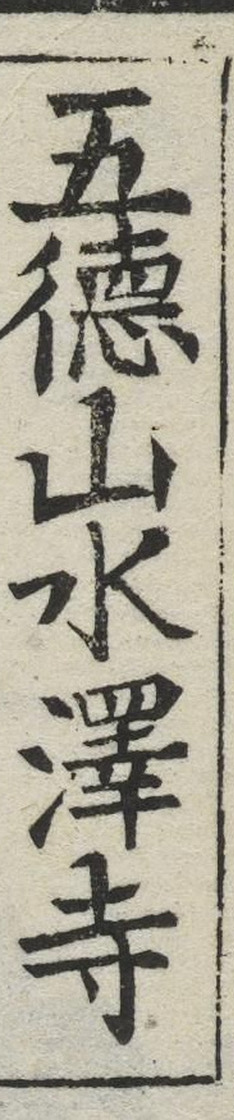五徳山水沢寺
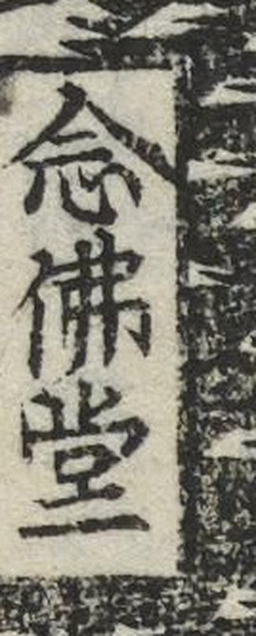念仏堂
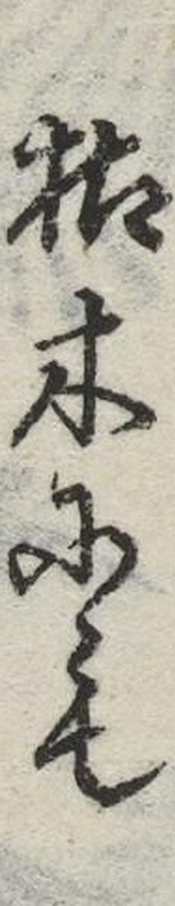枯木にも
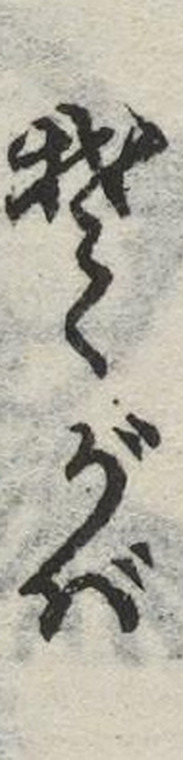そゝがば
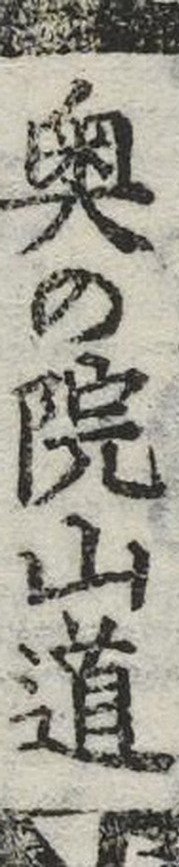奥の院山道
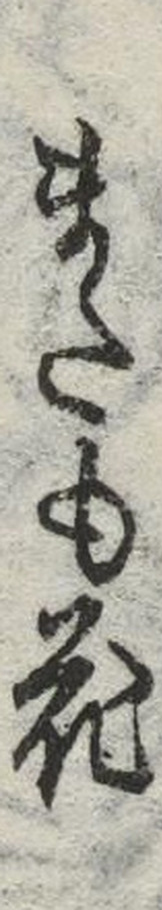またも花
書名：諸國温泉遊覽記　全
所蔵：東京大学地震研究所図書室 Earthquake Research Institute Library, The University of Tokyo, JAPAN
